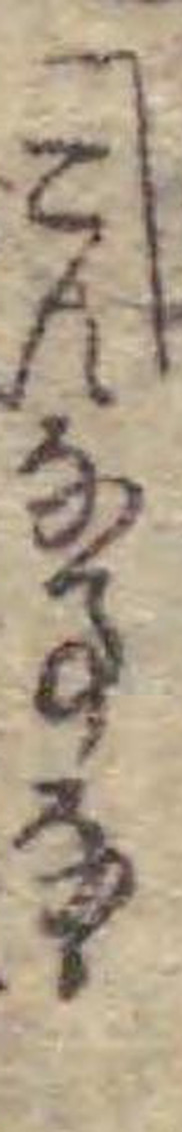〽こんな事なら
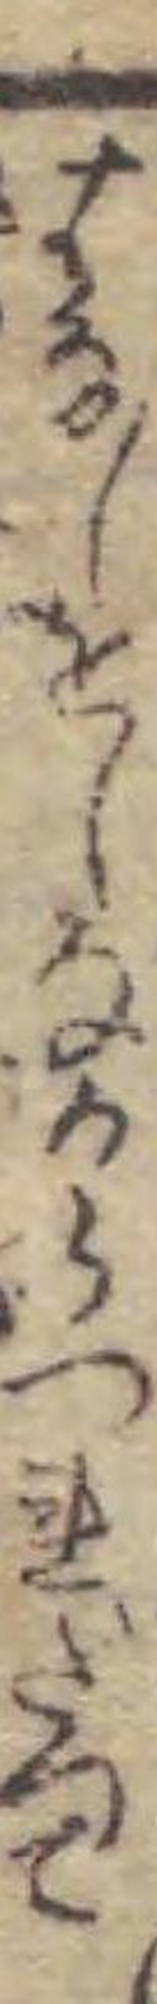はなしをしなからつれだつて
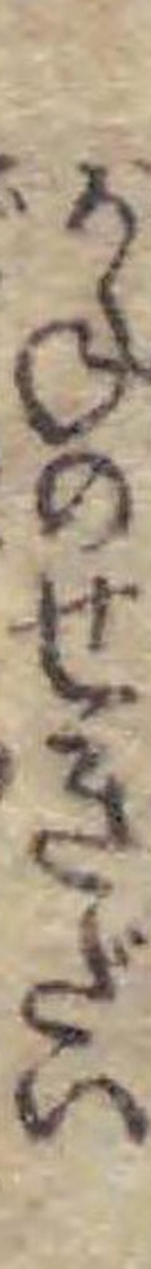かねのせきだい
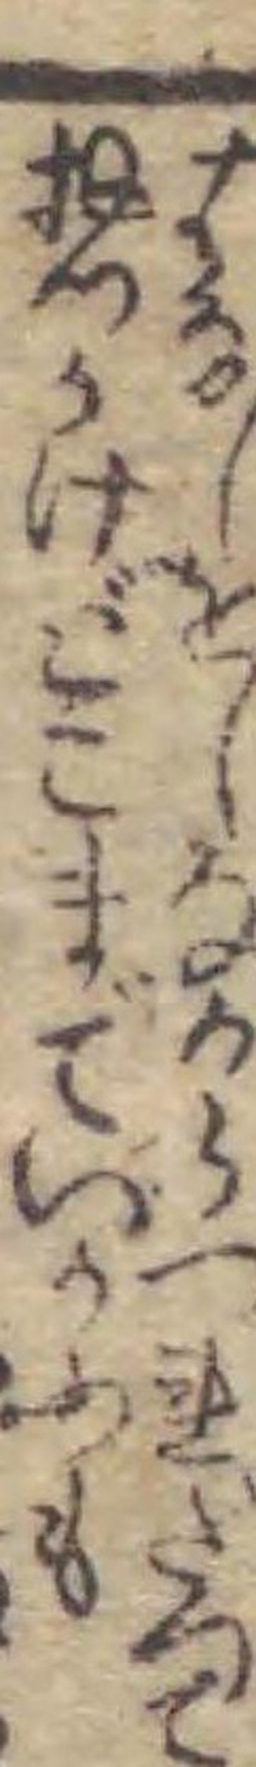おつかけどこまでいかふも
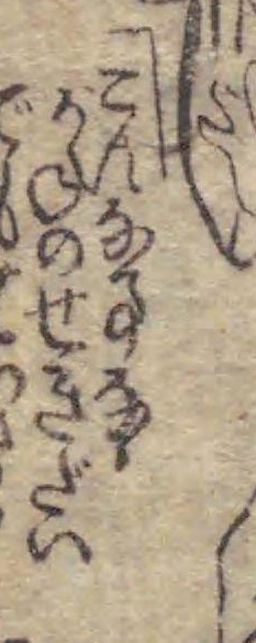〽こんな事なら
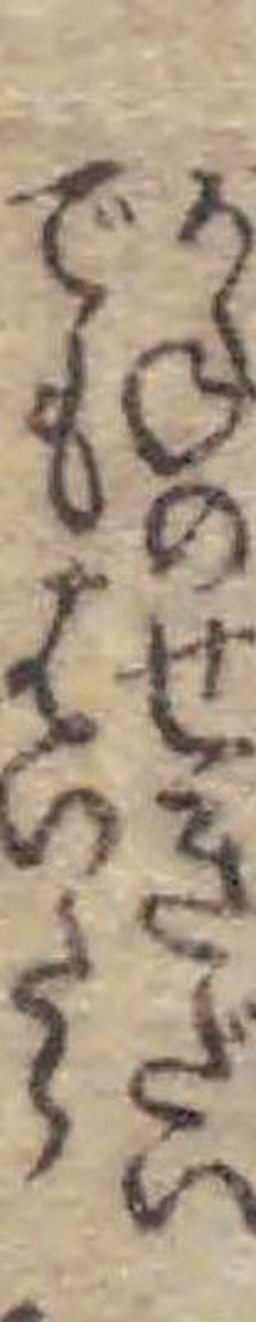でもはいたら
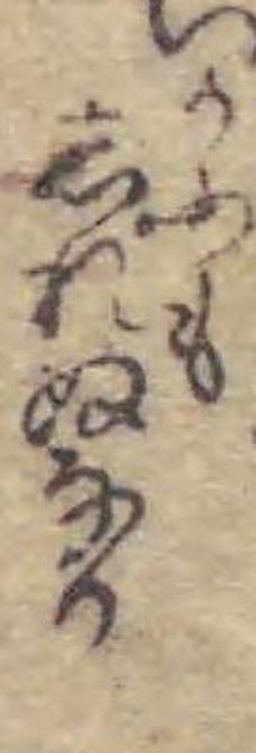しれぬなり
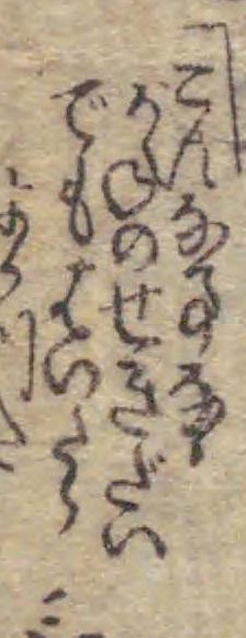でもはいたら
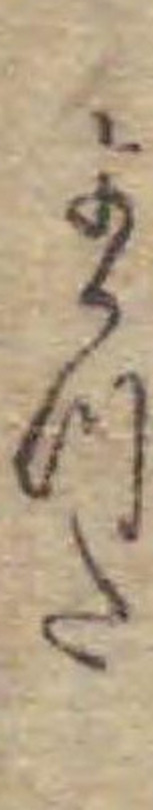よかつた
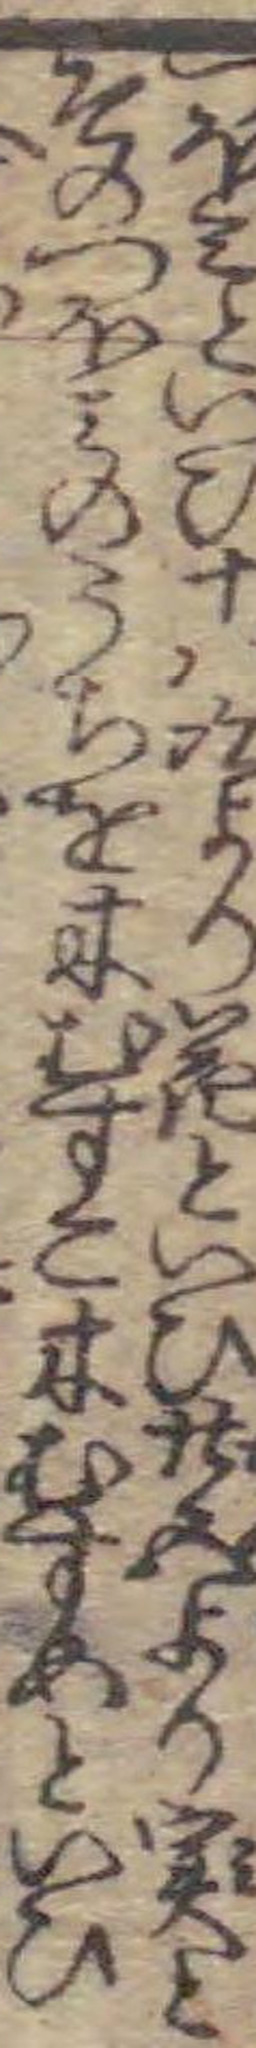そのつほみのうちを木むすこ木むすめといひ
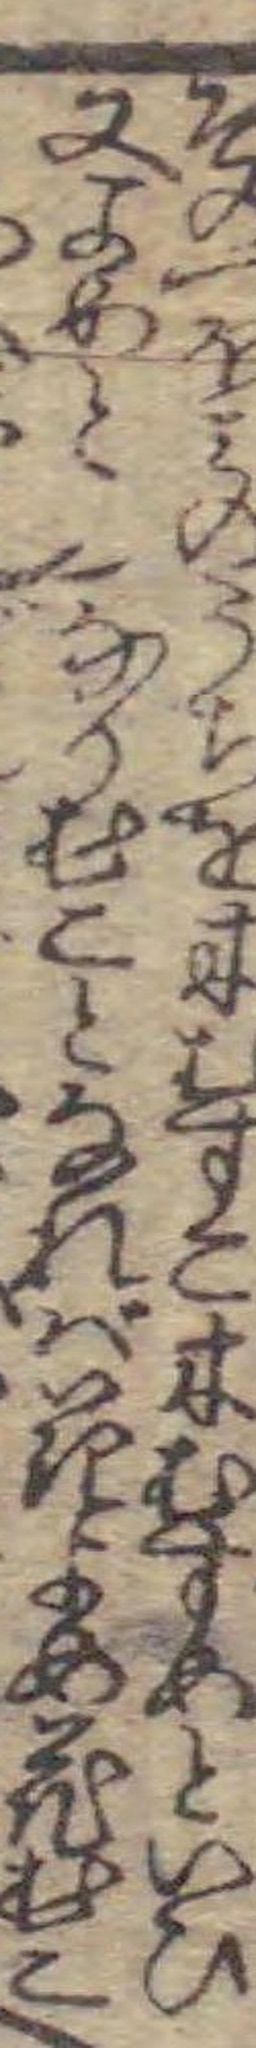又よめとなりむことなれば花よめ花むこ
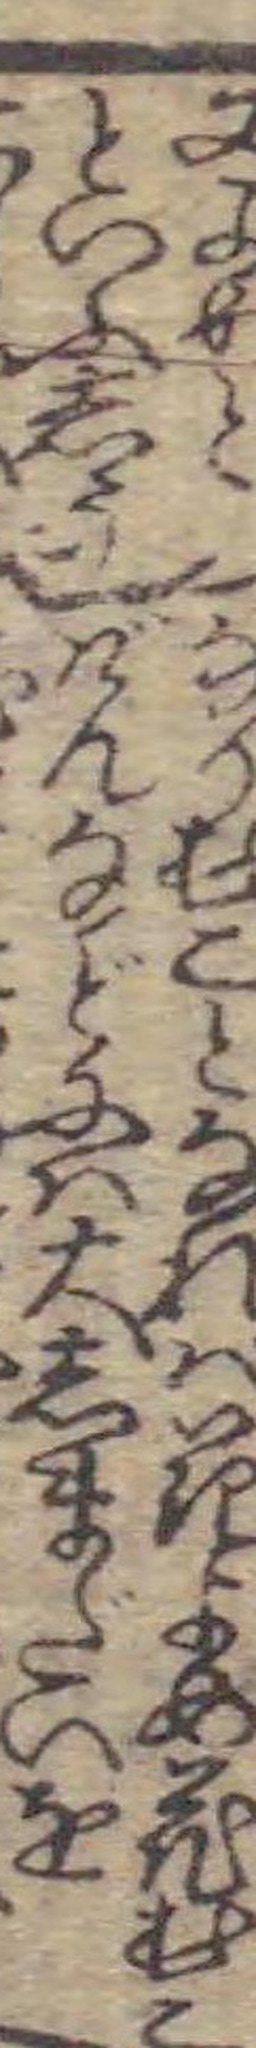といふしうげんなどには大しまだいを
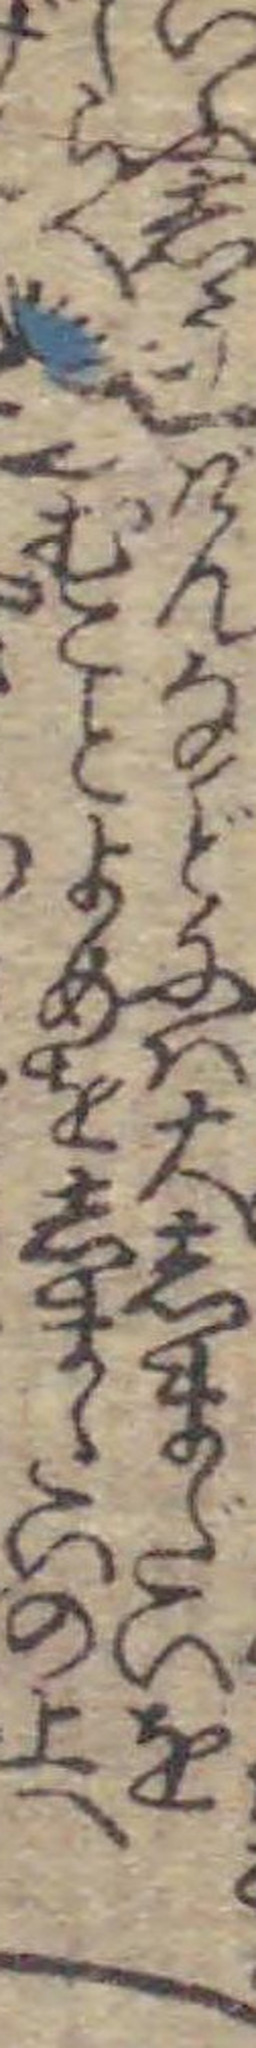こしらへむことよめをしまたいの上へ
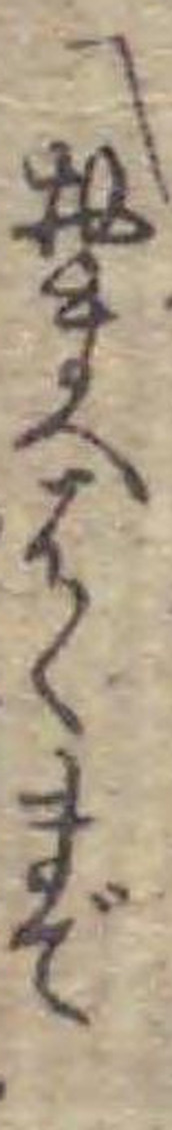〽おあへはくまで
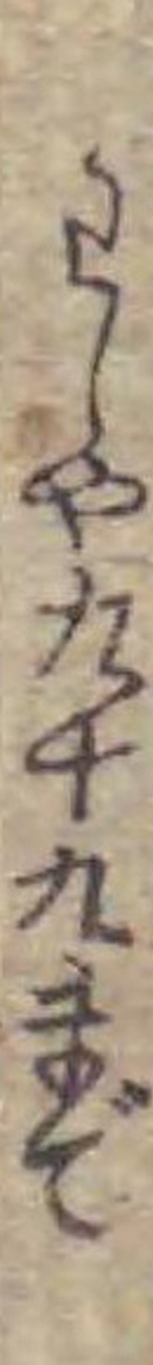わしや九十九まで
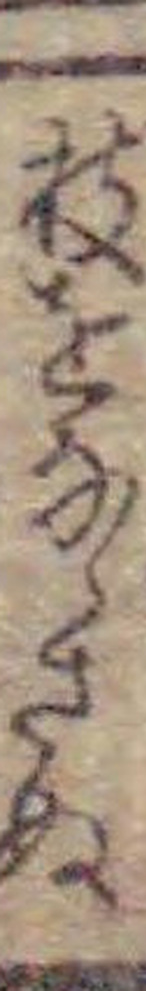枝をならさぬ
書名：奇妙頂礼胎錫杖 : 3巻
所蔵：国立国会図書館 National Diet Library, JAPAN
